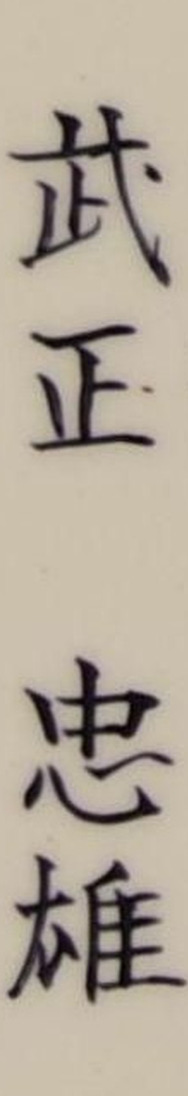武正忠雄
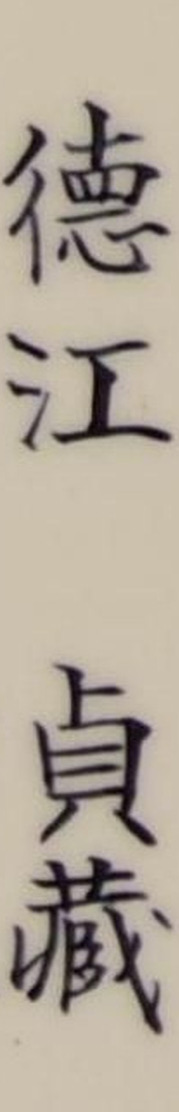徳江貞蔵
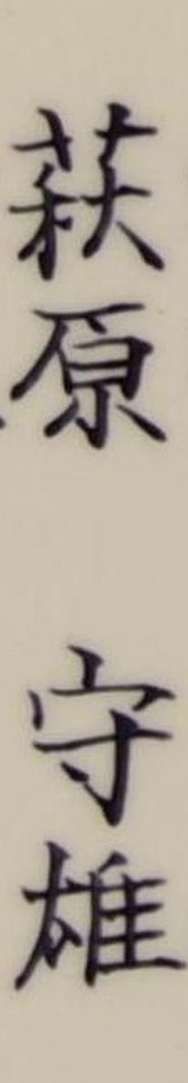萩原守雄
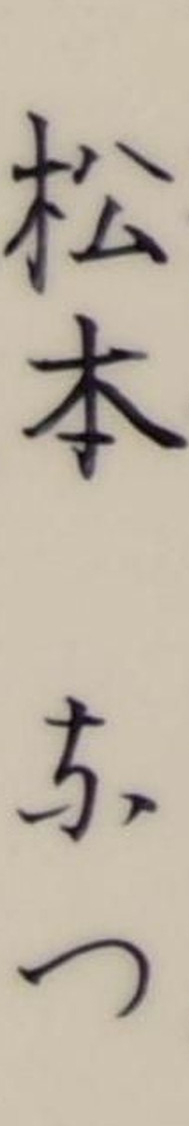松本なつ
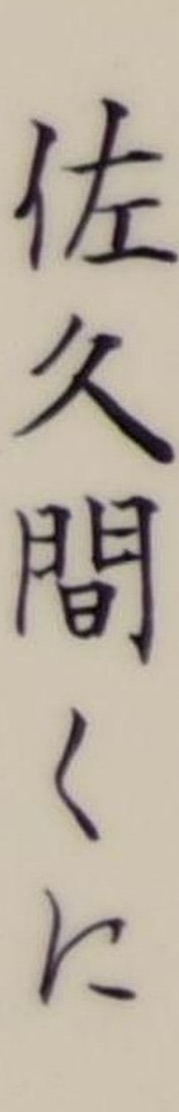佐久間くに
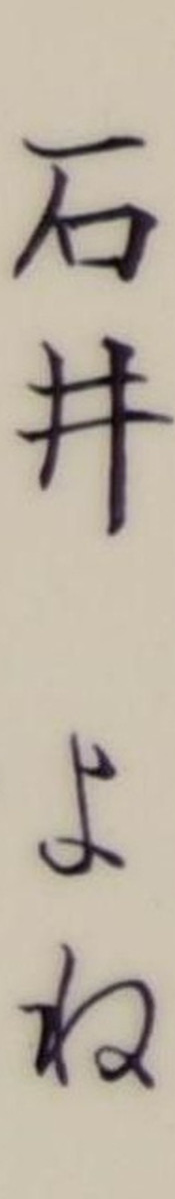石井よね
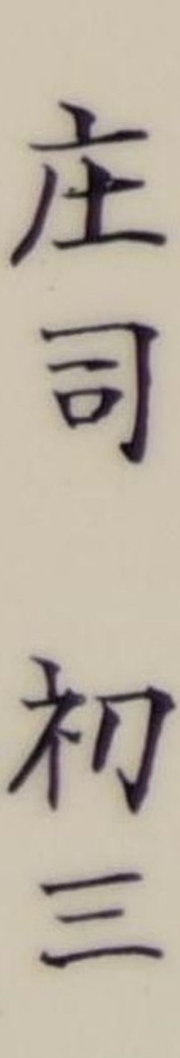庄司初三

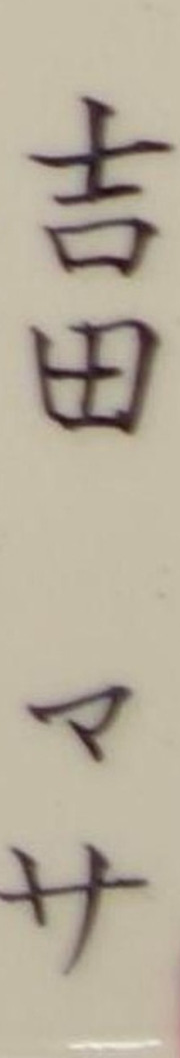吉田マサ
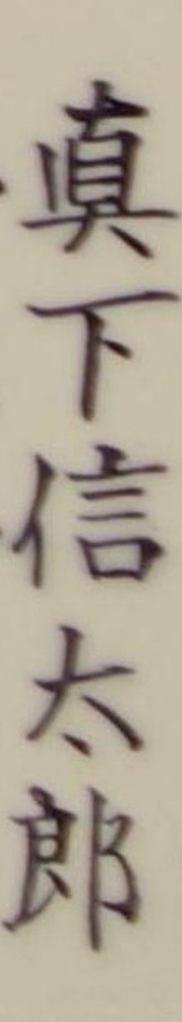真下信太郎
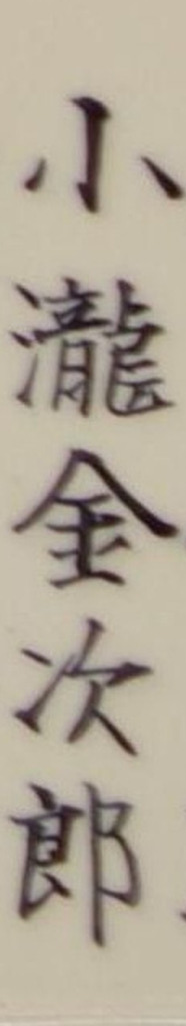小瀧金次郎
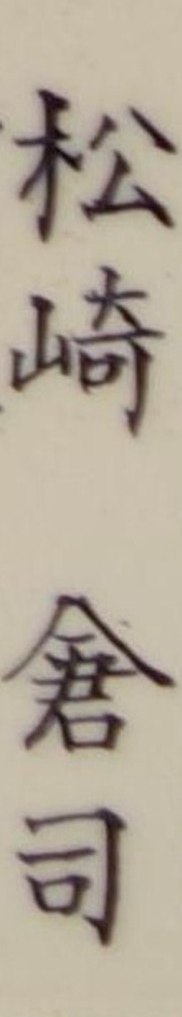松崎倉司
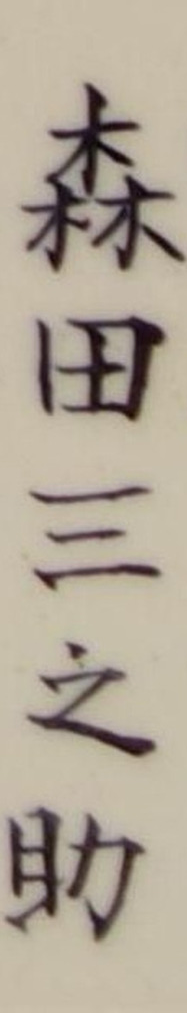森田三之助
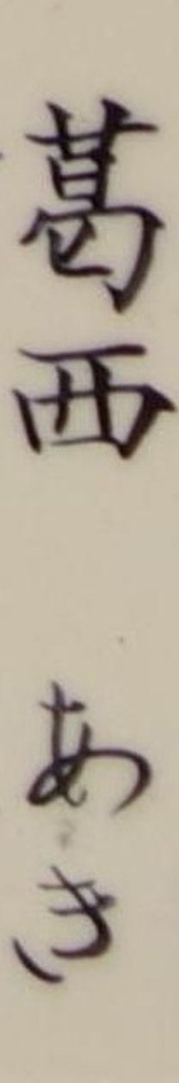葛西あき
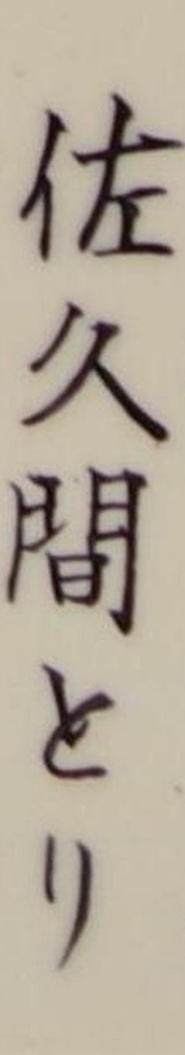佐久間とり
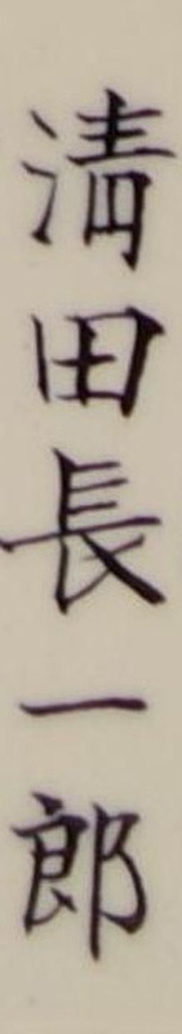清田長一郎
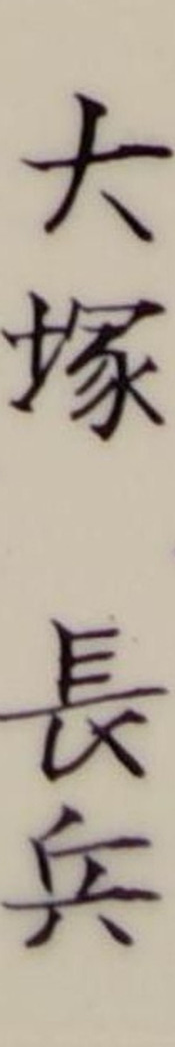大塚長兵
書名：M~S
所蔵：高野山金剛峯寺
